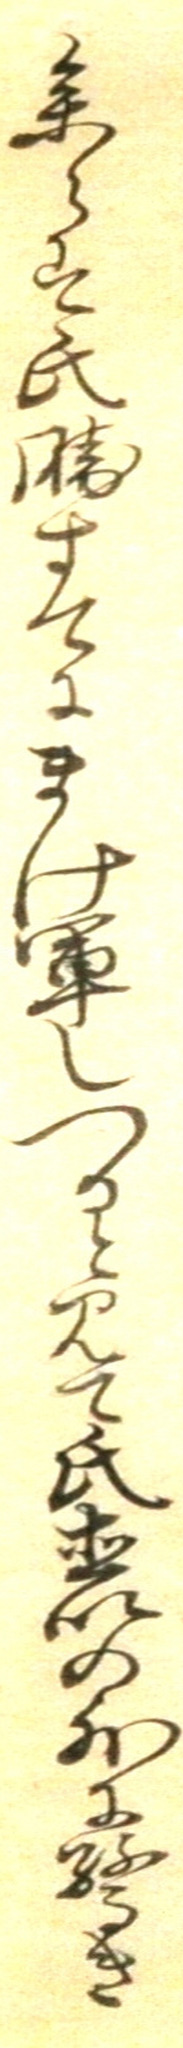参らす氏勝すてにまけ軍しつると見て氏直以の外に驚き
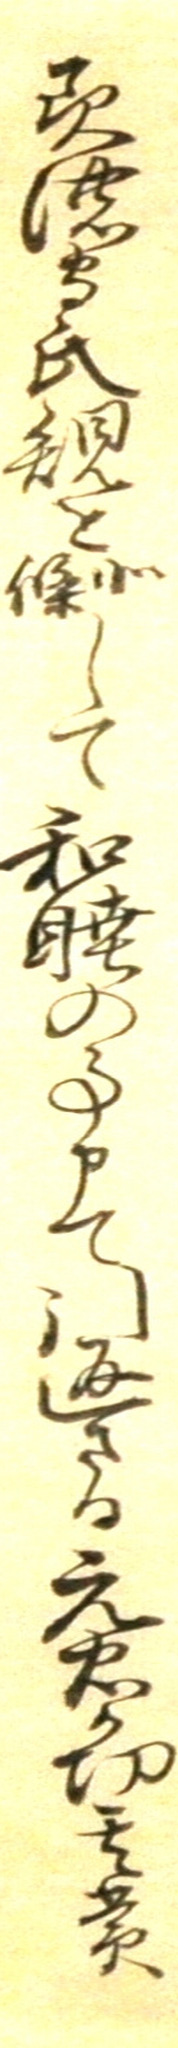美濃守氏規を北條して和睦の事申て引返さる元忠か功其賞
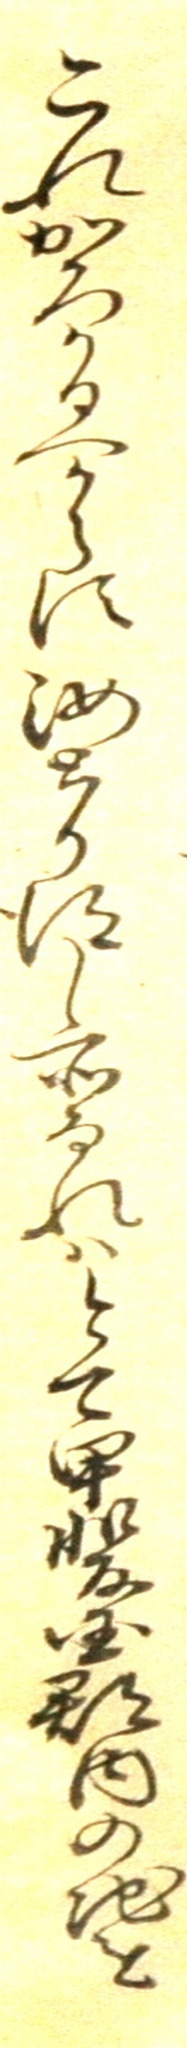これかろかるへからす汝とり得し所なれはとて甲斐国郡内の地を

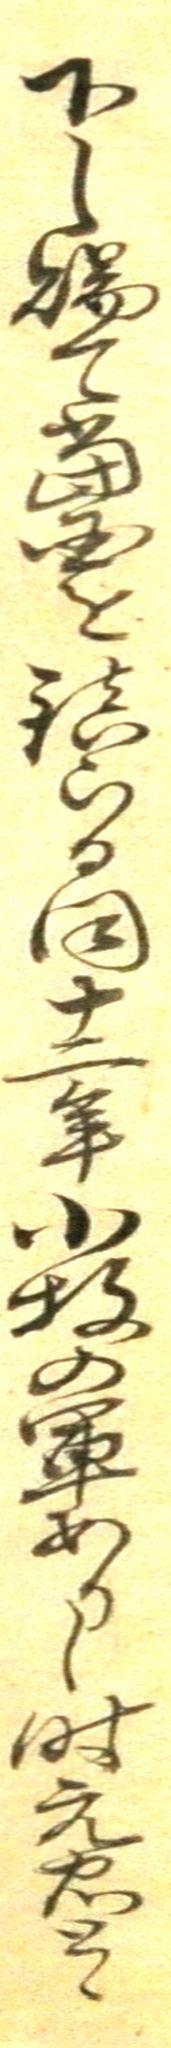下し賜て当国を鎮らる同十二年小牧の軍ありし時元忠とゝ
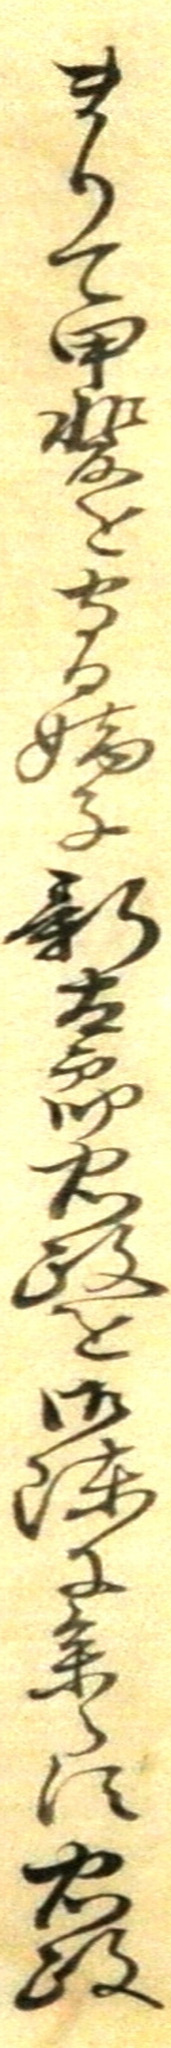まりて甲斐を守る嫡子新太郎忠政を御陣に参らす忠政
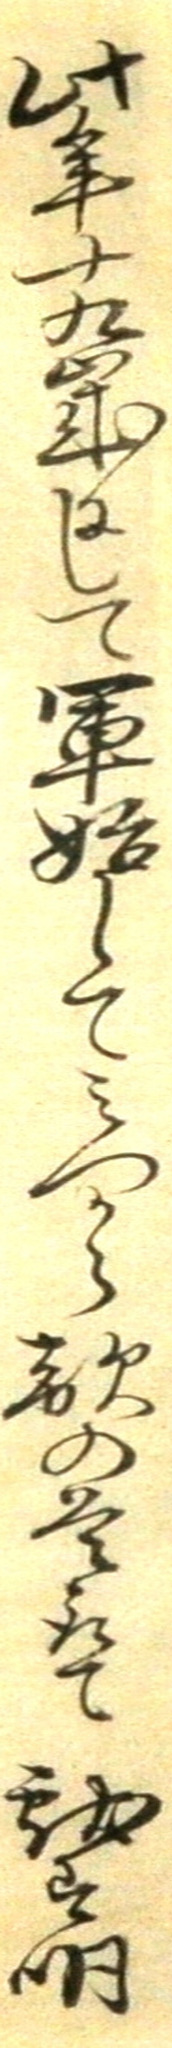此年十九歳にして軍始してみつから敵の首取て献す明
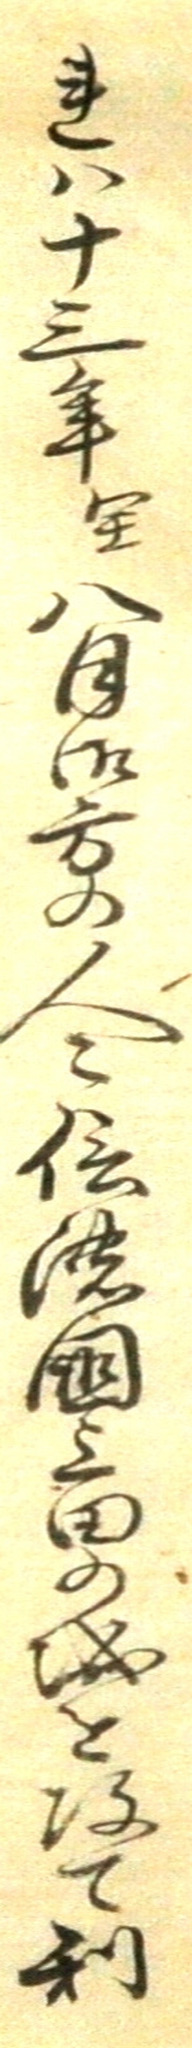れは十三年閏八月御方の人々信濃国上田の城を攻て利
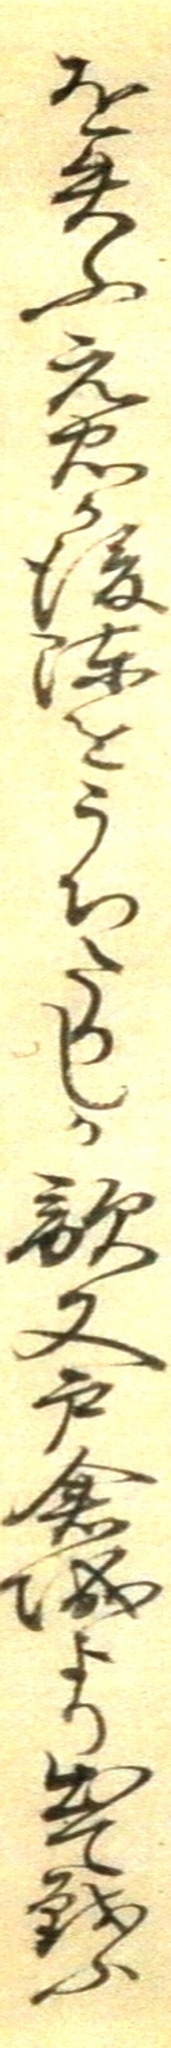を失ふ元忠か後陣をうちたりしか敵又戸倉城より出て戦ふ
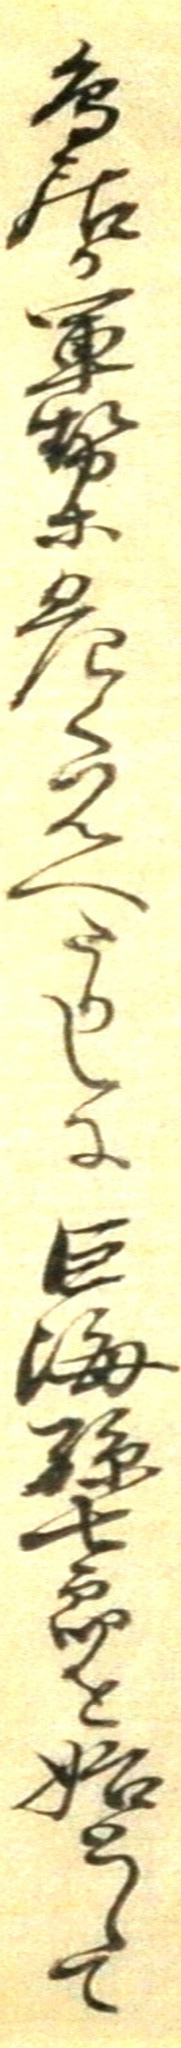鳥居か軍勢等危く見へたりしに巨海孫七郎を始として
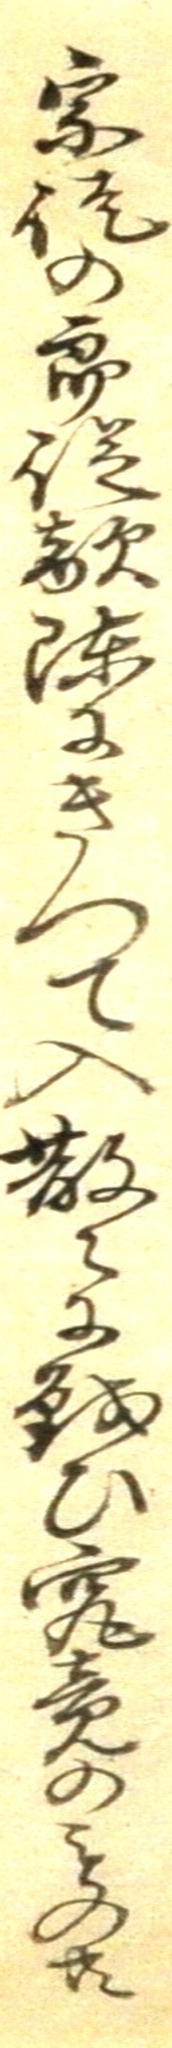宗徒の郎従敵陣にきつて入散々に戦ひ究竟のもの共
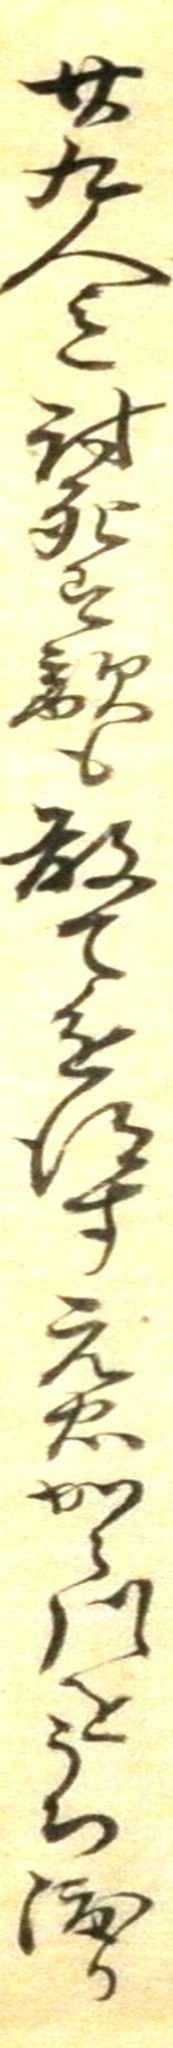廿九人迄討死す敵も敢て進得す元忠から川をうち渡り
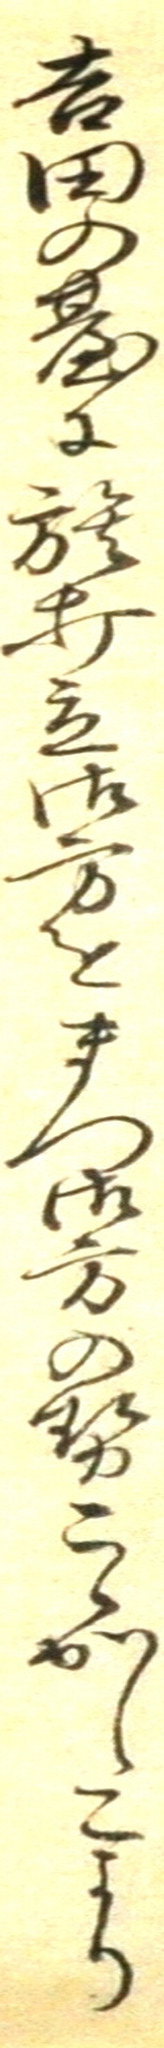吉田の台に旗打立御方をまつ御方の勢こゝかしこより
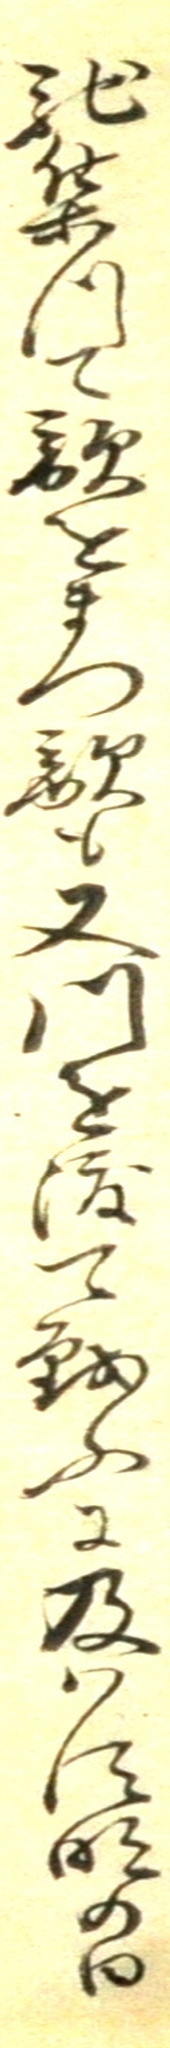馳集つて敵をまつ敵も又川を渡て戦ふに及はす明の日
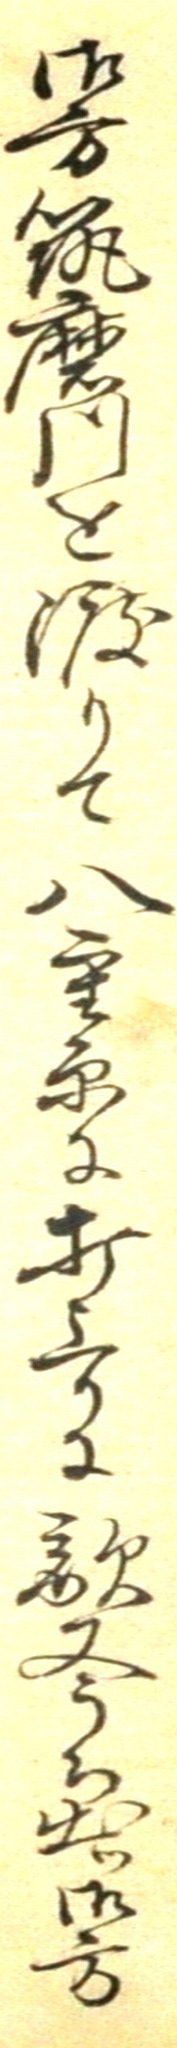御方筑磨川を渡りて八重原に打上りに敵又うち出ツ御方
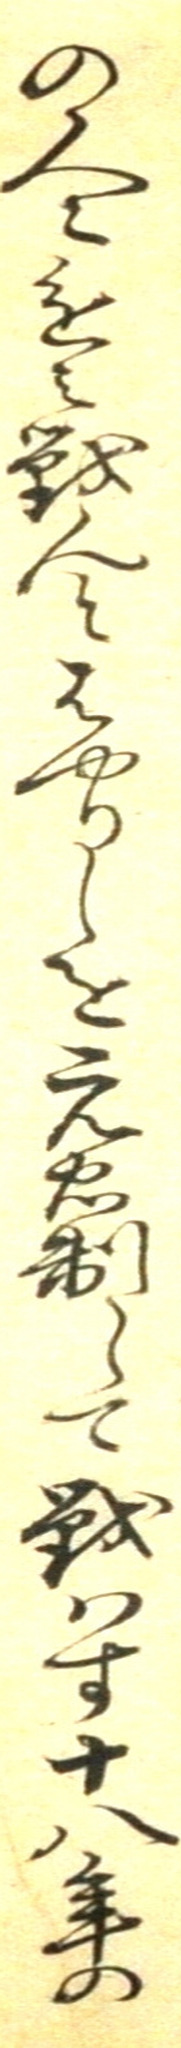の人々進み戦んとはやりしを元忠制して戦はす十八年の
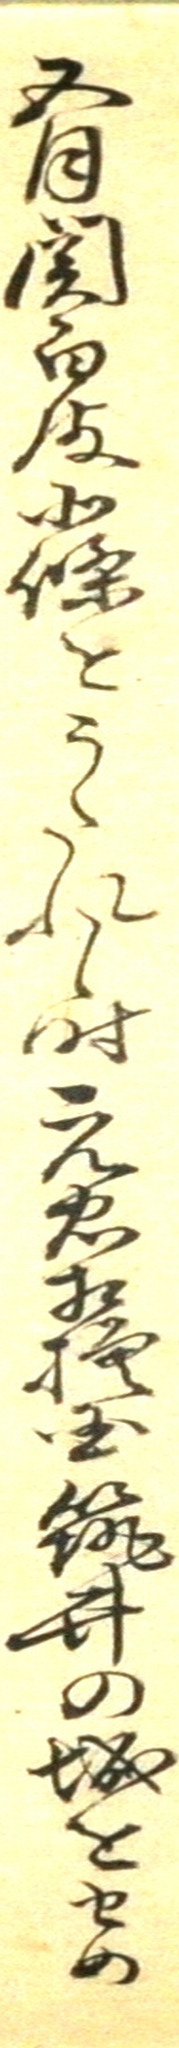五月関白殿北條をうたれし時元忠相模国筑井の城をせめ
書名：藩翰譜（四・中）
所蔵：伊那市立高遠町図書館・合同会社AMANE
